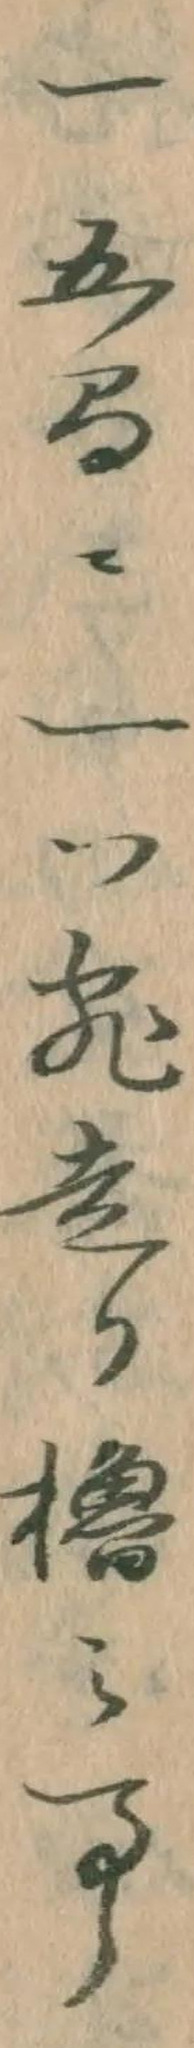一五間に一つ究走り櫓之事
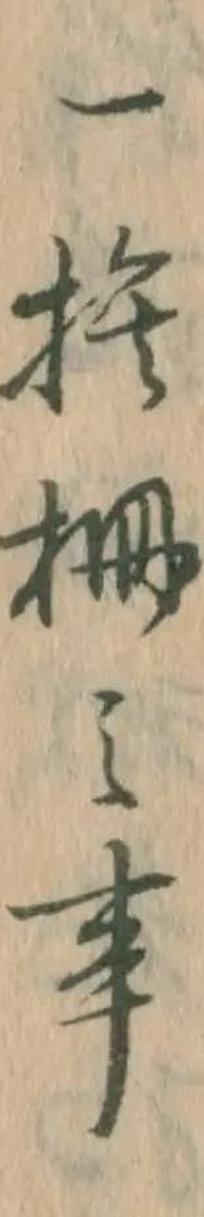一捨柵之事
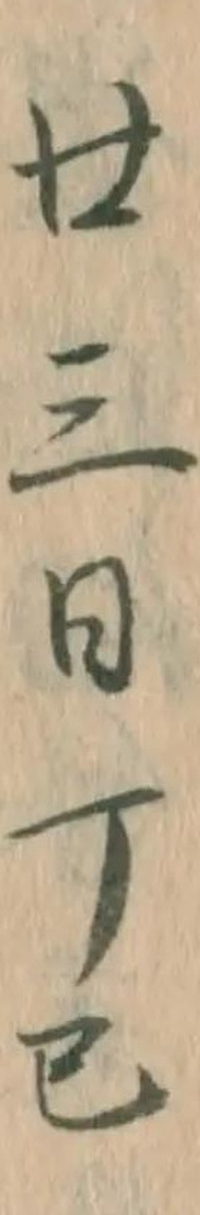廿三日丁巳
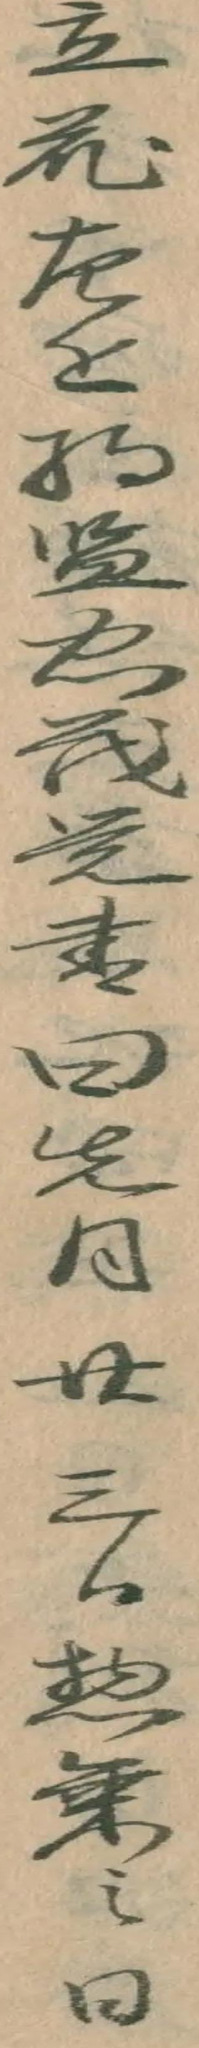立花左近将監忠茂覚書曰先月廿三日惣乗之日
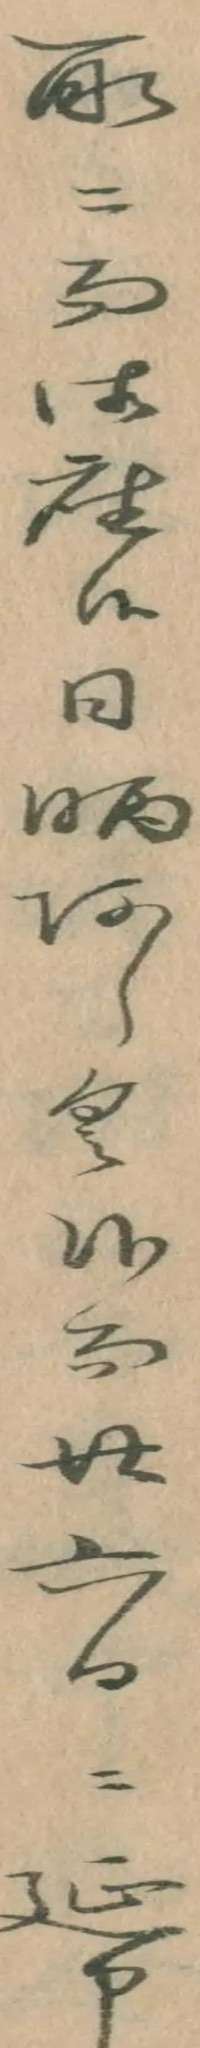取に而御座候日晒阿し具候而廿六日に延申

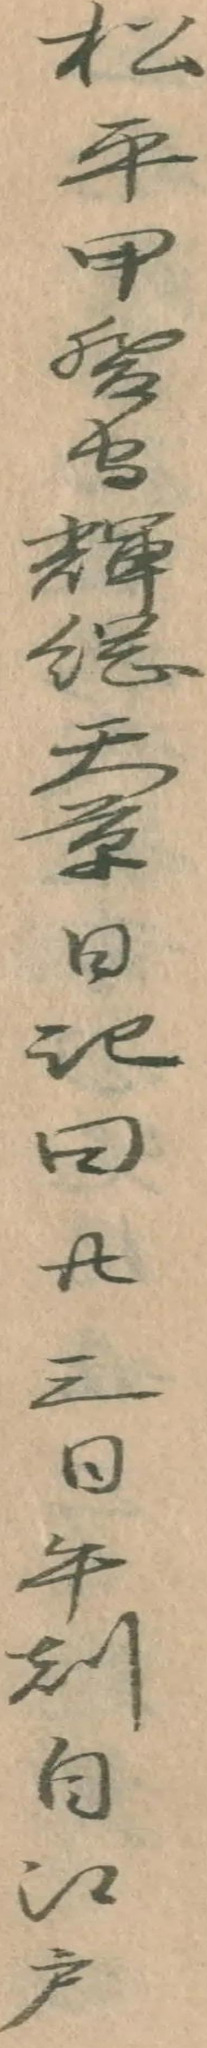松平甲斐守輝綱天草日記曰廿三日午刻自江戸
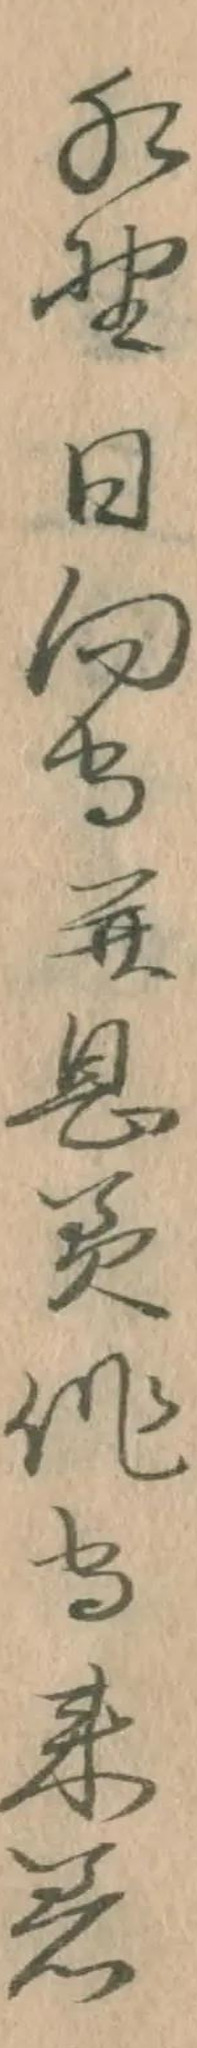水野日向守幷息美作守来着
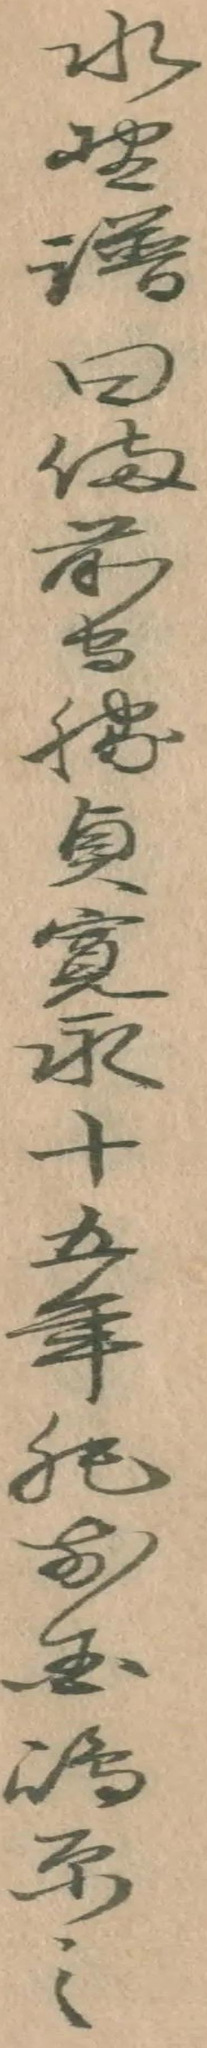水野譜曰備前守勝貞寛永十五年肥前国島原之
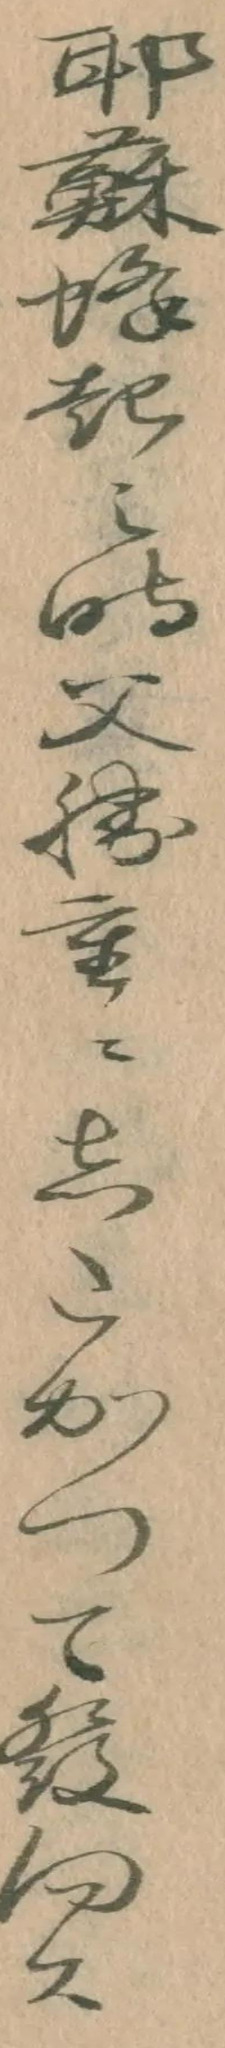耶蘇蜂起之時父勝重に志た加つて発向す
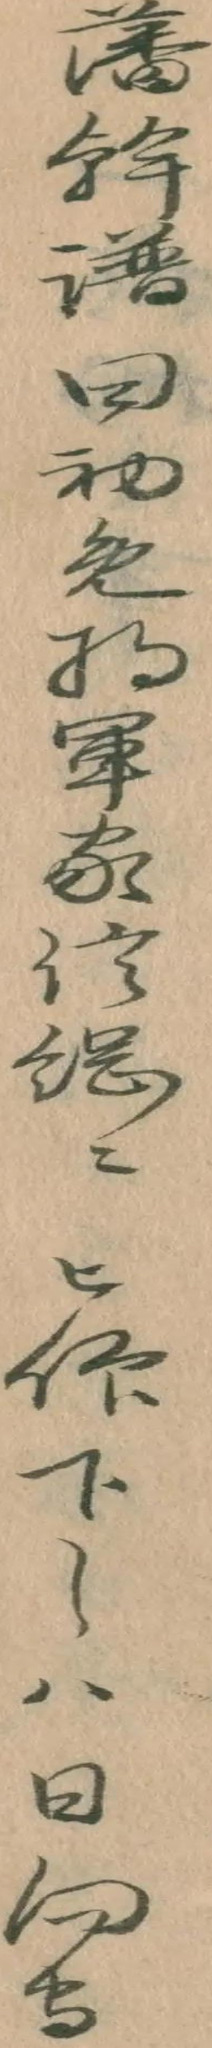藩幹譜曰初免将軍家信綱に被仰下しは日向守
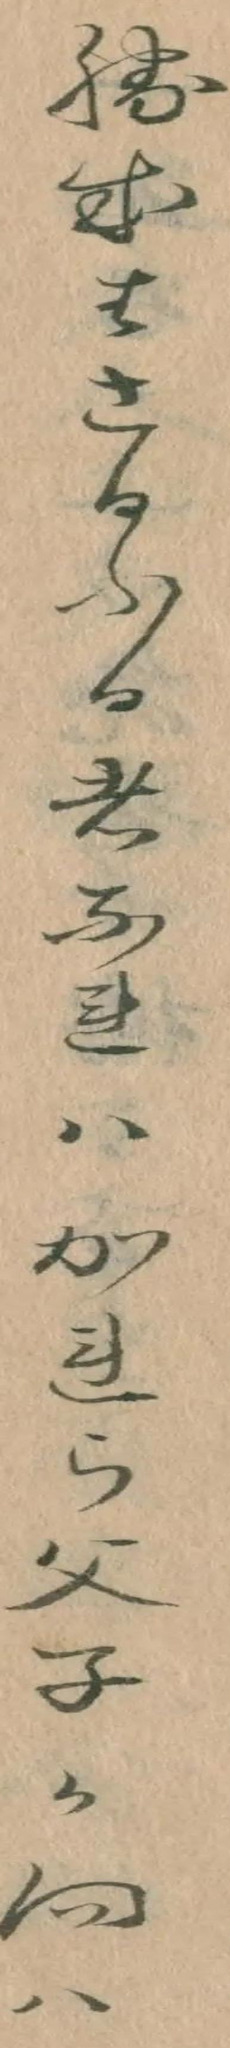勝成者さるふる者ふ連は加連ら父子か向は
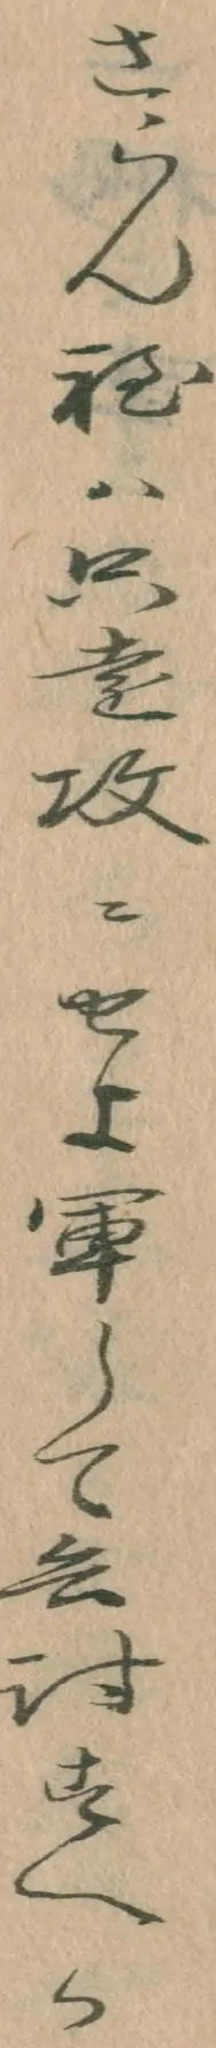さらん程は只遠攻にせよ軍して兵討春へか
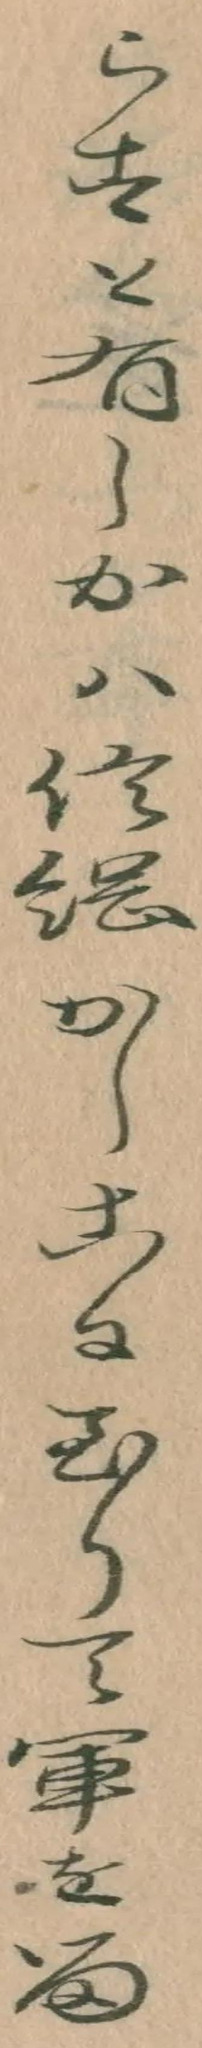ら春と有しかは信綱かし古尓至りて軍を留
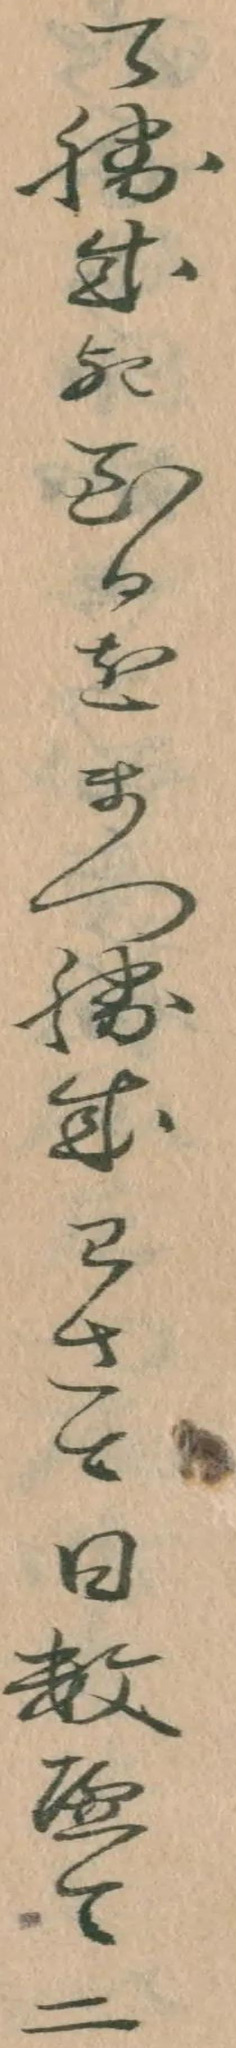て勝成歟至るをまつ勝成已さて日数扁て二
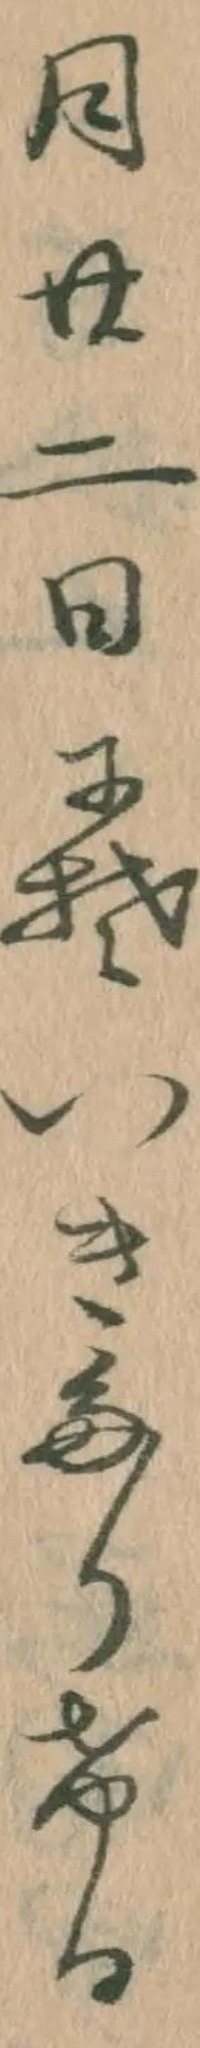月廿二日尓楚いき多り希る
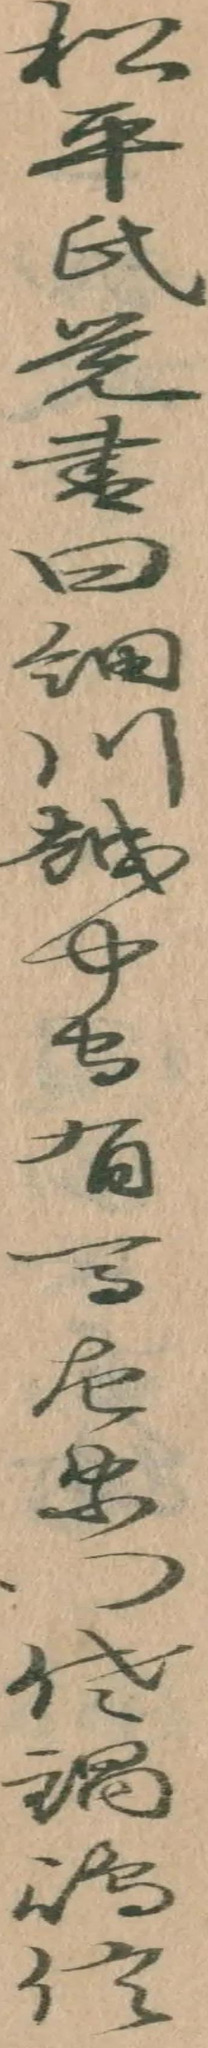松平氏覚書曰細川越中守有馬左衛門佐鍋島信
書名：切支丹御退治記 49巻. [7]
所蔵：国立国会図書館 National Diet Library, JAPAN
